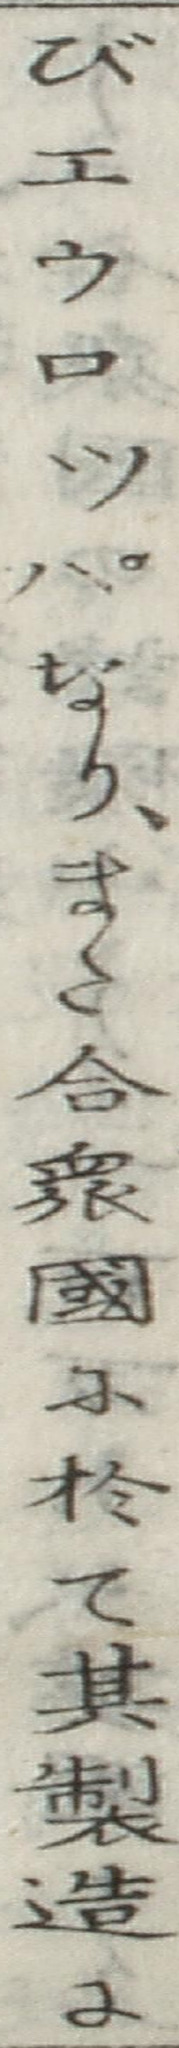びエウロツパなり、また合衆国に於て其製造に
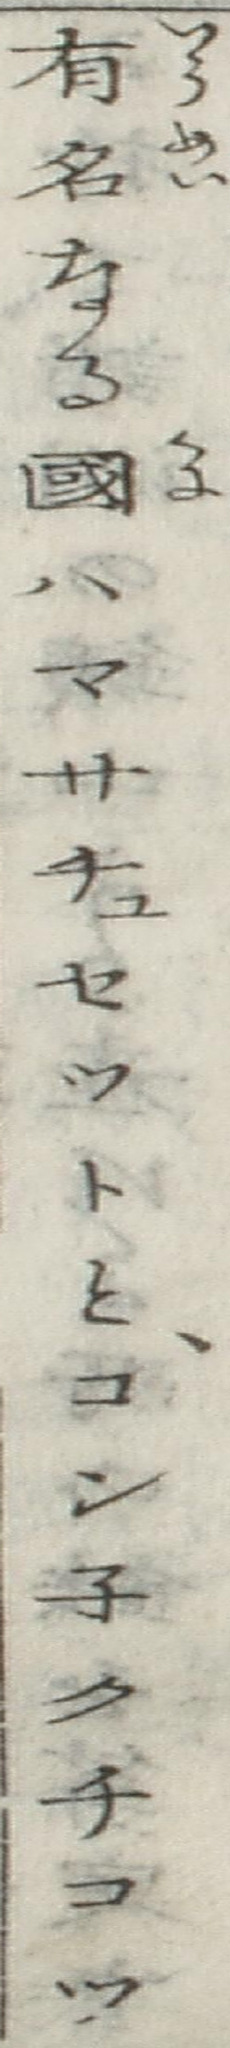有名なる国はマサチュセツトと、コン子クチコツ
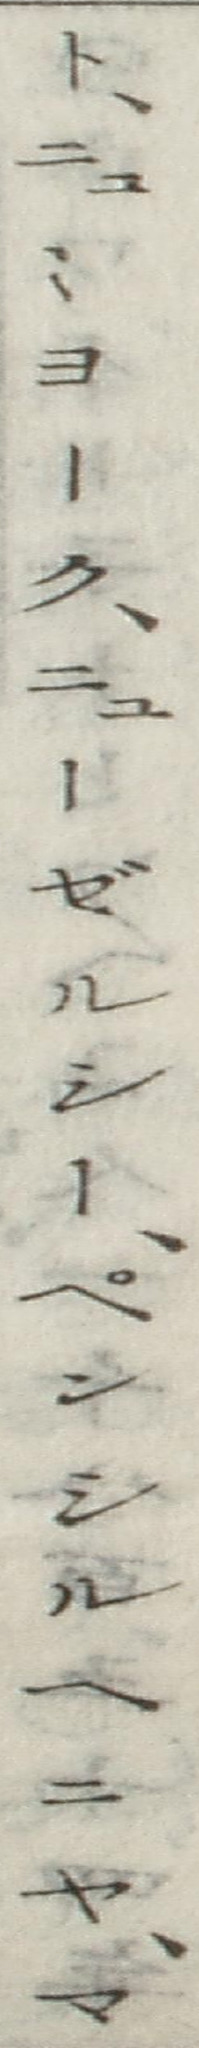ト、ニュウヨーク、ニューゼルシー、ペンシルヘニヤ、マ
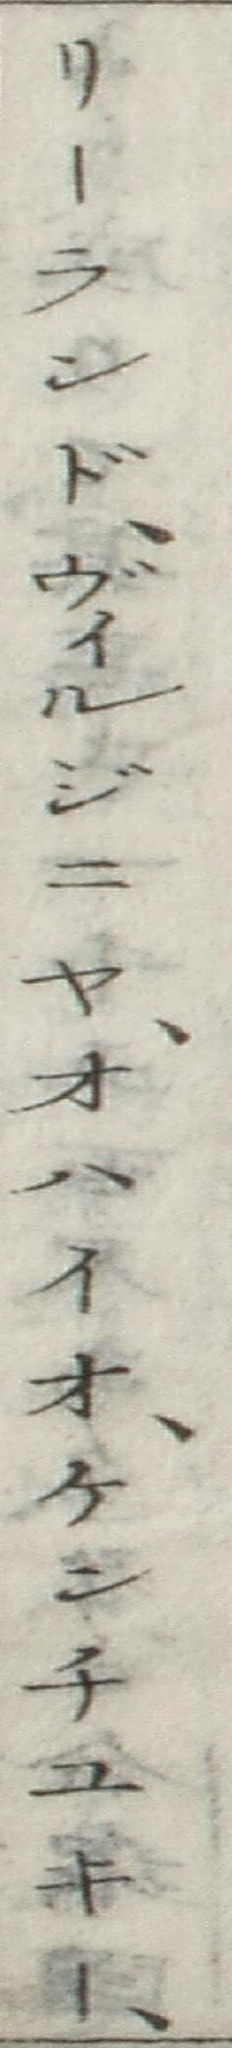リーランド、ヴィルジニヤ、オハイオ、ケンチユキー、
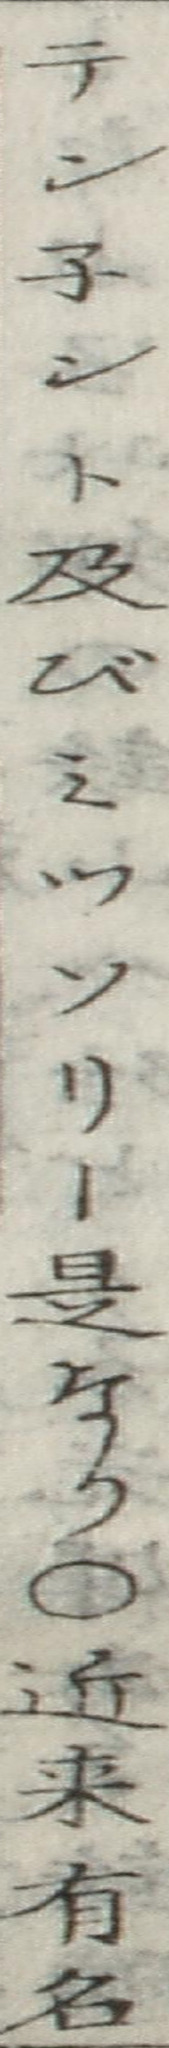テン子ント及びミツソリー是なり○近来有名

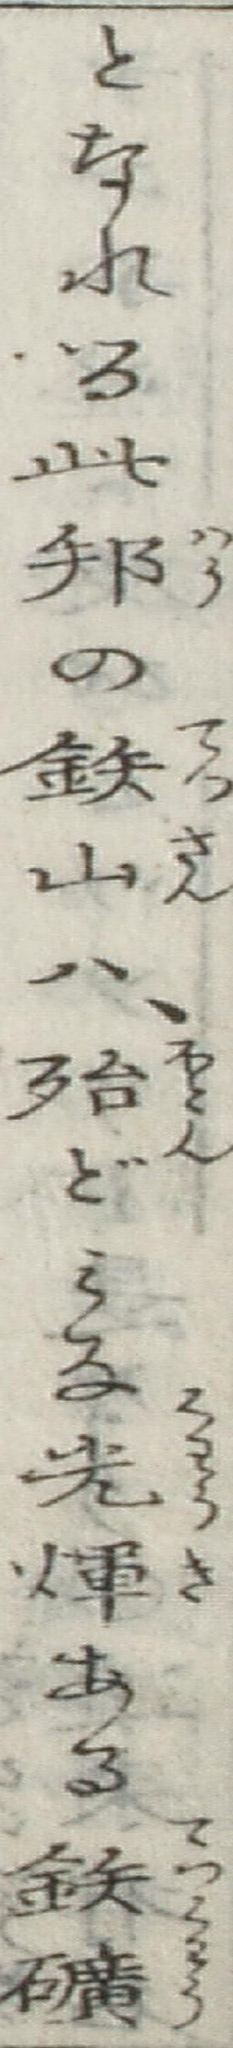となれる此邦の鉄山は、殆どみな光輝ある鉄砿
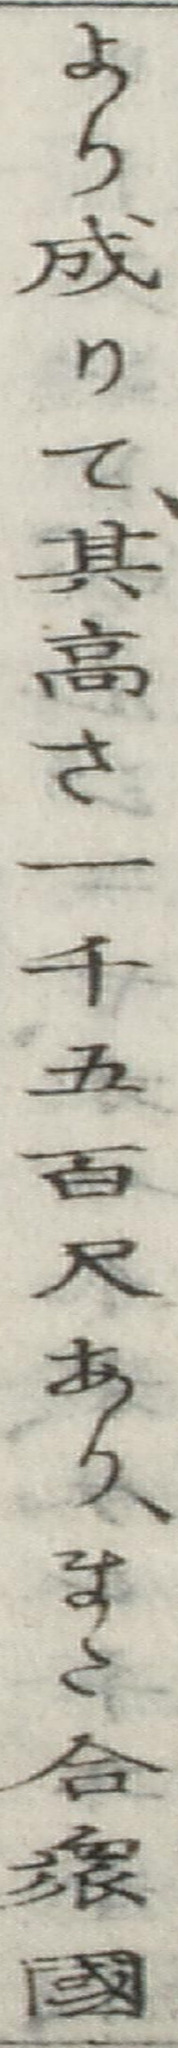より成りて、其高さ一千五百尺あり、また合衆国
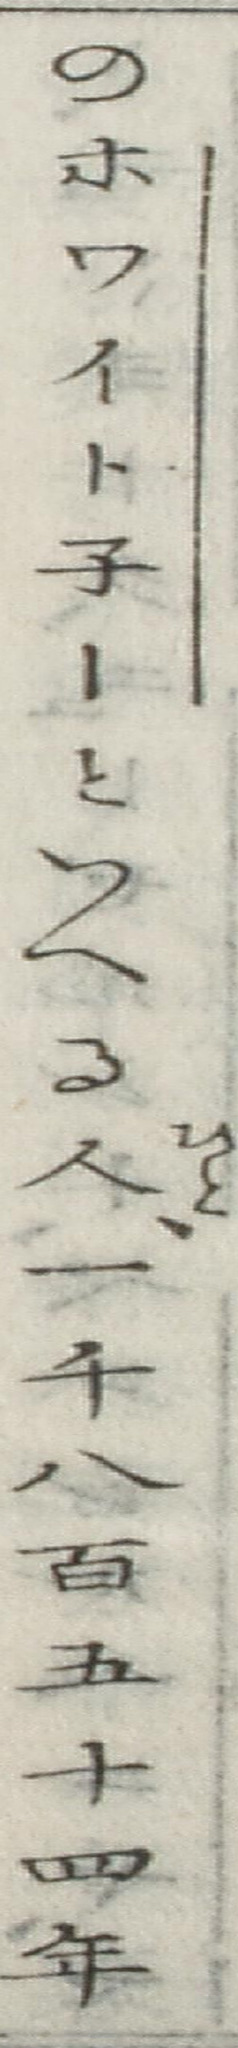のホワイト子ーといへる人、一千八百五十四年
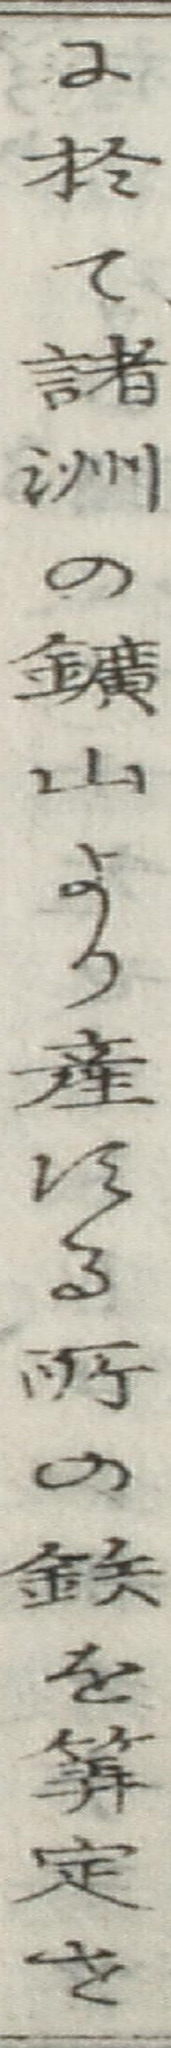に於て、諸洲の鉱山より産する所の鉄を算定せ
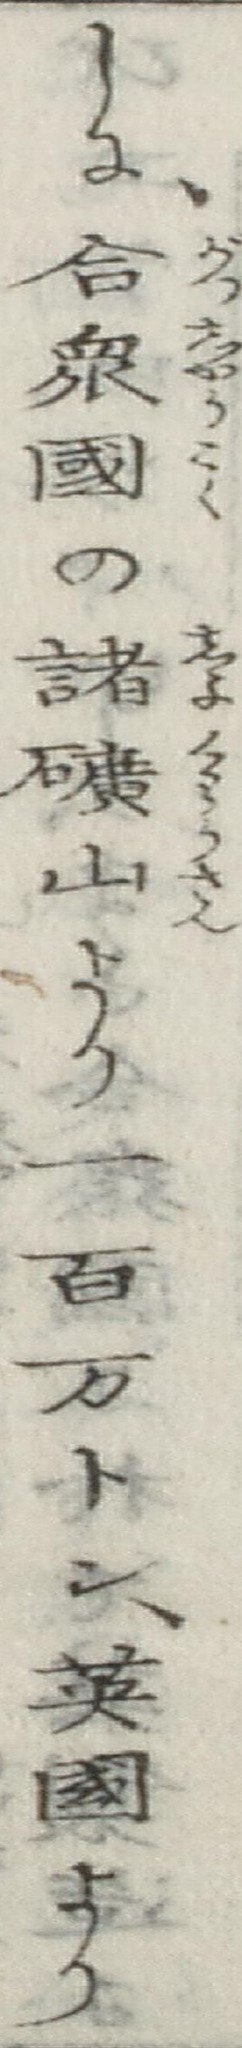しに、合衆国の諸砿山より一百万トン、英国より
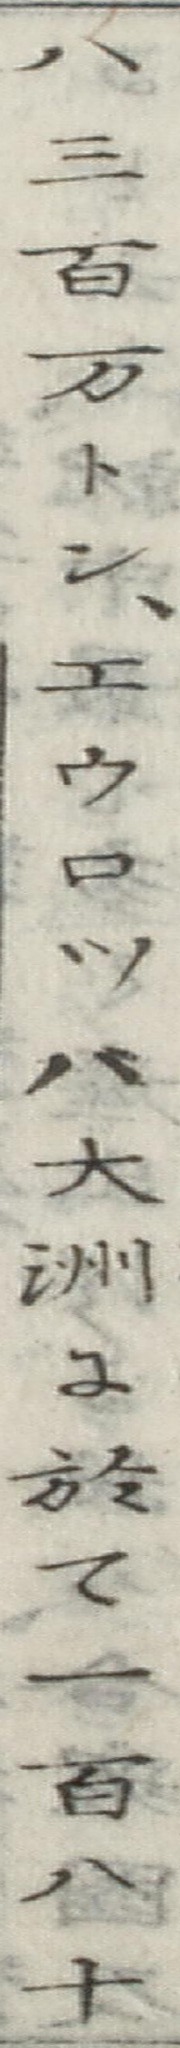は三百万トン、エウロツパ大洲に於て一百八十
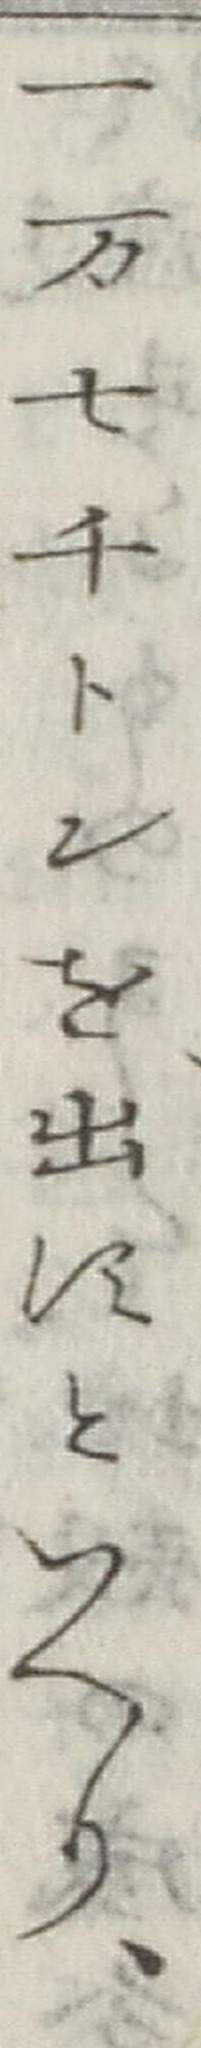一万七千トンを出すといへり、
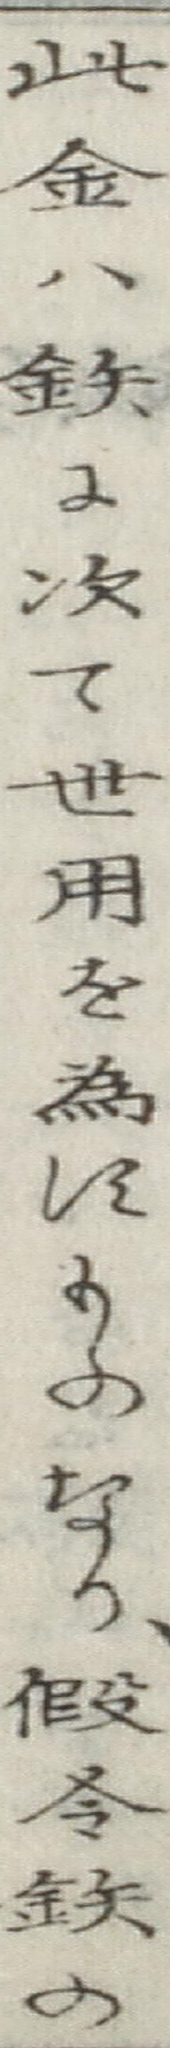此金は鉄に次て世用を為すものなり、仮令鉄の
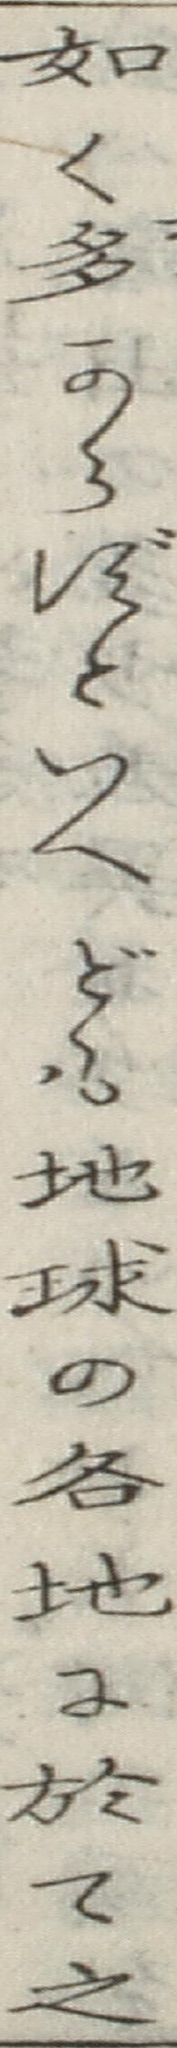如く多からずといへども、地球の各地に於て之
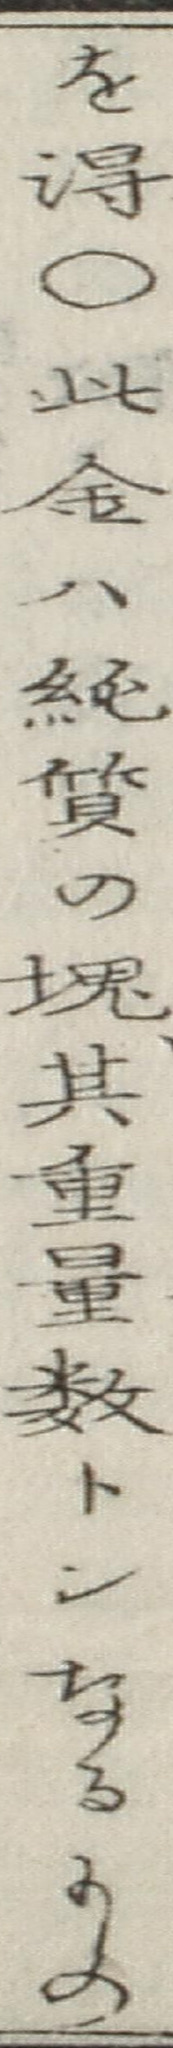を得○此金は純質の塊、其重量数トンなるもの
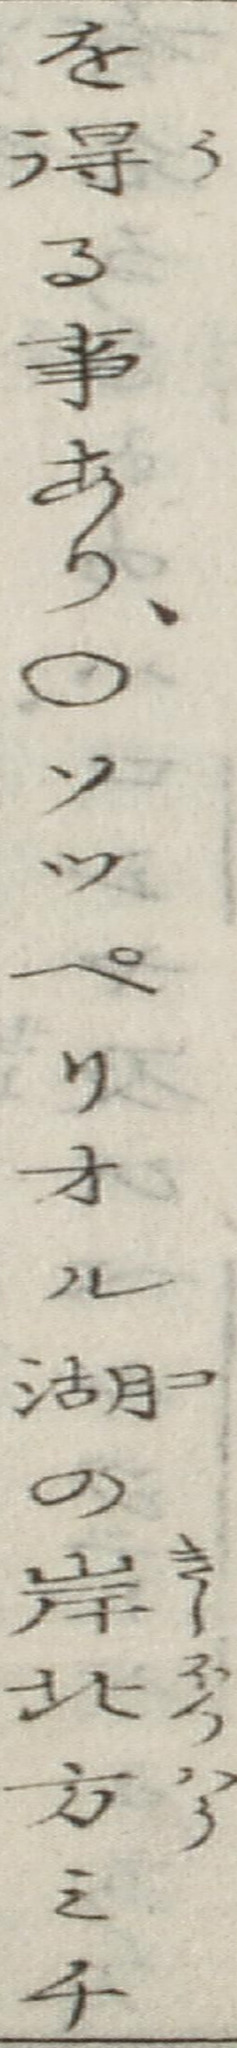を得る事あり、○ソツペリオル湖の岸北方ミチ
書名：訓蒙　天然地理學　下
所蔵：東京大学地震研究所図書室 Earthquake Research Institute Library, The University of Tokyo, JAPAN
